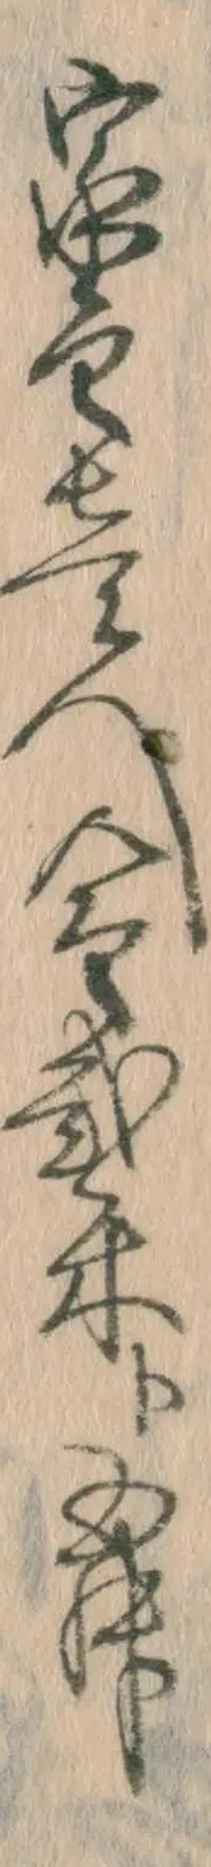家主壱人金弐朱ト五升
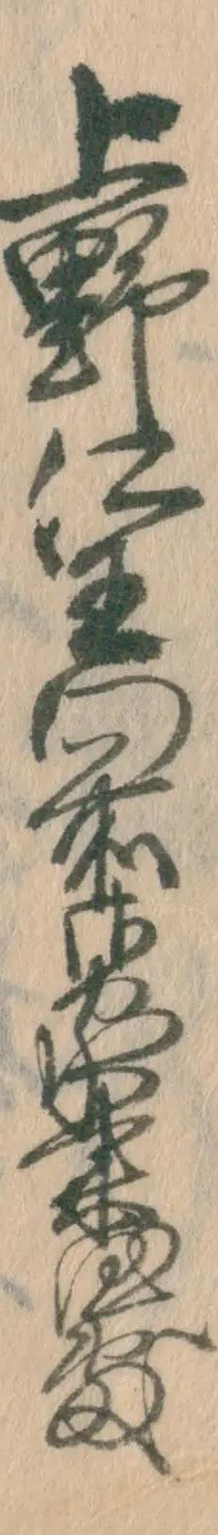上野仁王門前御家来屋敷
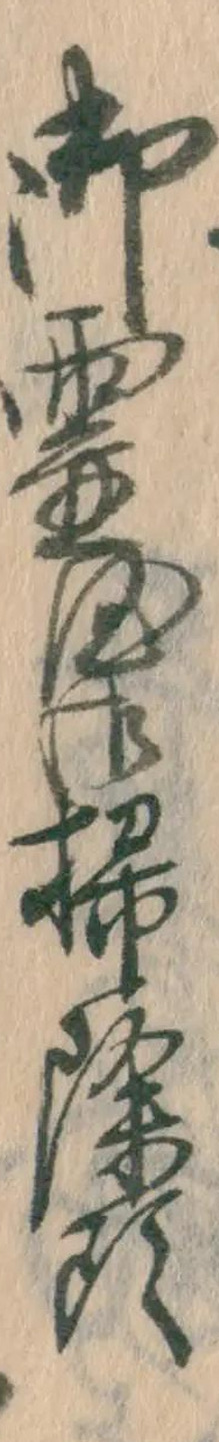御霊屋御掃除頭
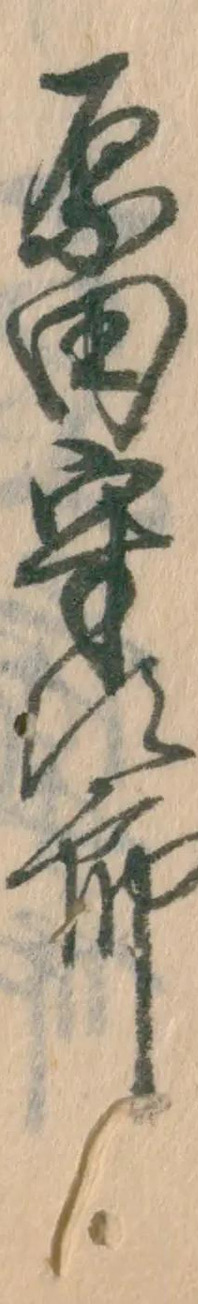原田守次郎

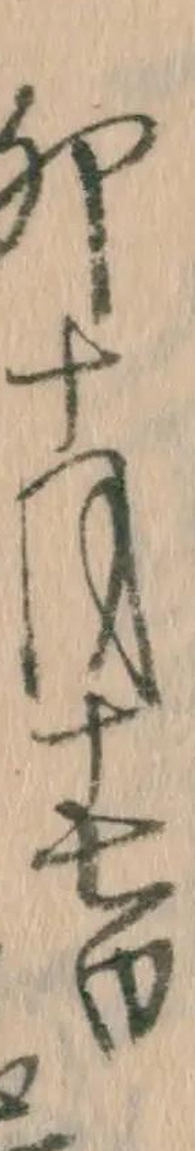卯十月十七日
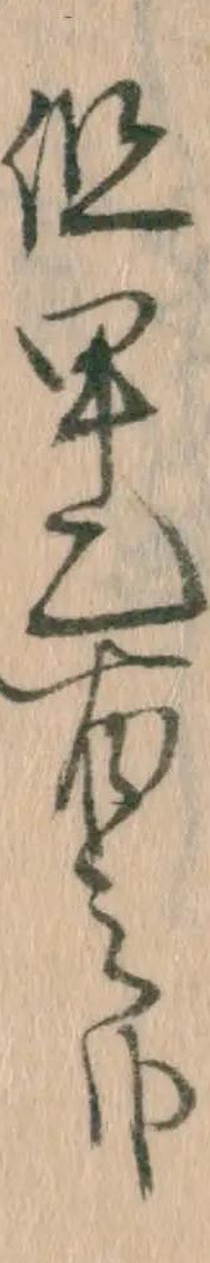但甲乙有之候
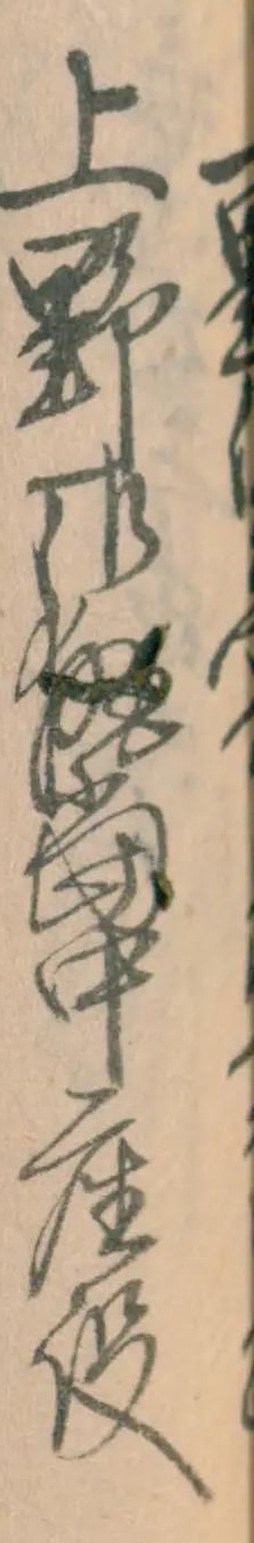上野御執当中座役
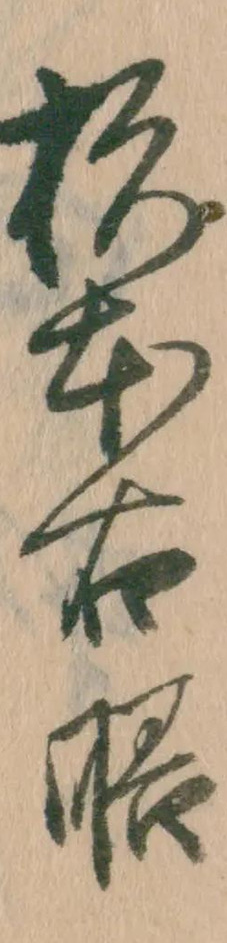杉本右膳
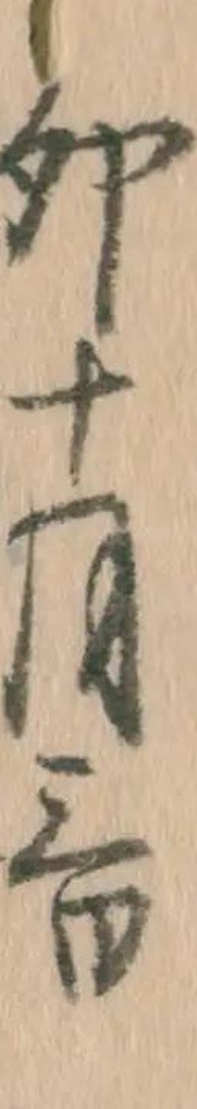卯十月三日

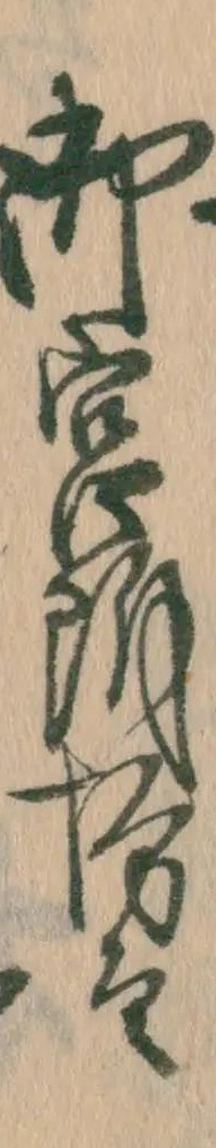御宮附坊主
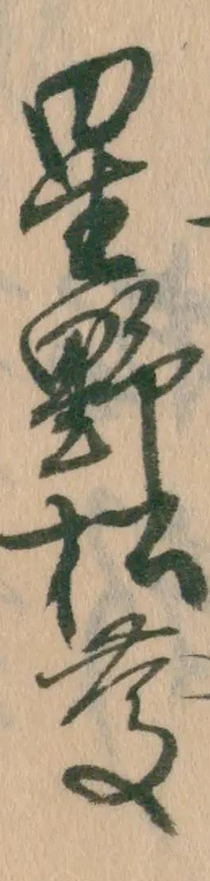星野松慶
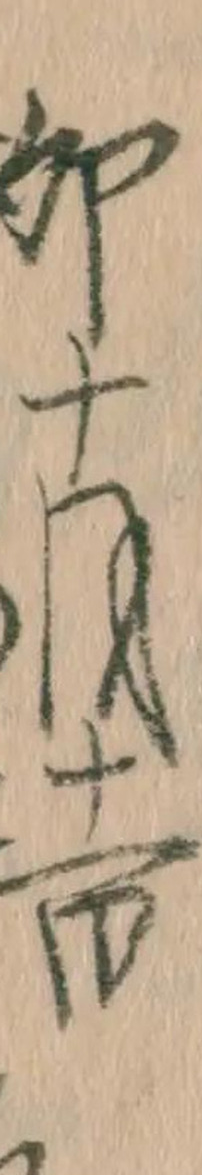卯十月十一日
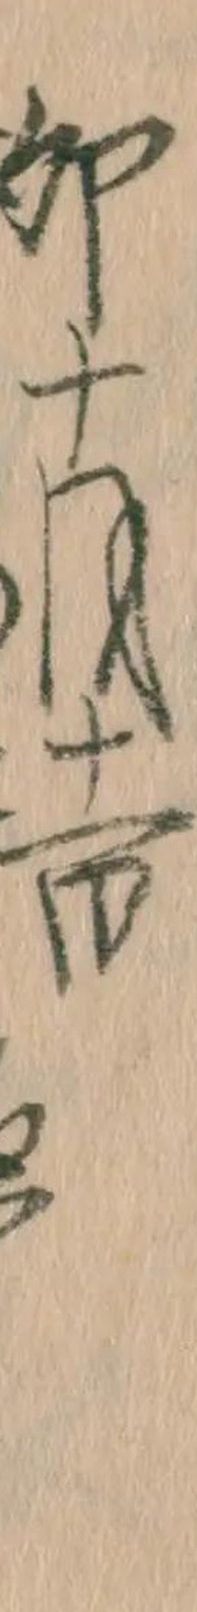卯十月十一日
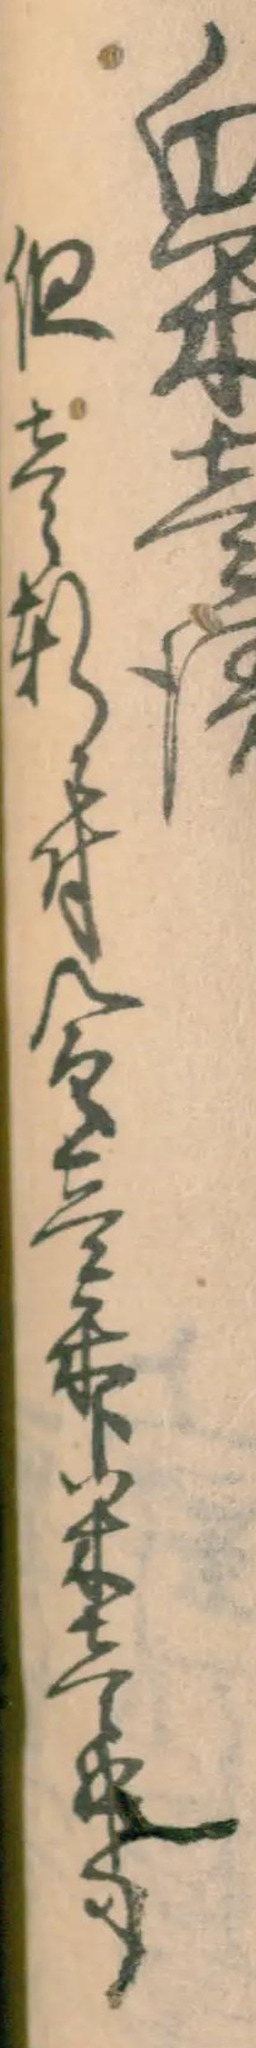但壱軒ニ付金壱朱ト米壱斗ツヽ
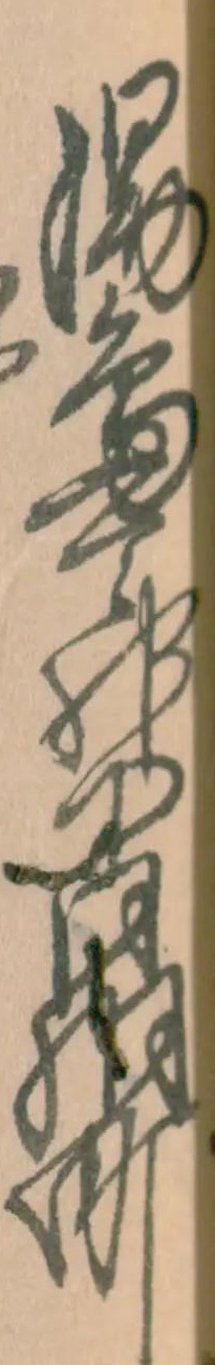湯島天神下同朋町
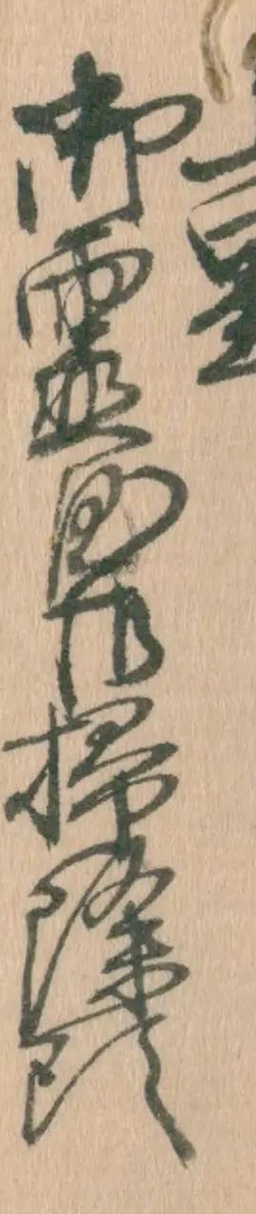御霊屋御掃除頭
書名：武家方并寺院等ニテ施差出候一件
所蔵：国立国会図書館 National Diet Library, JAPAN
